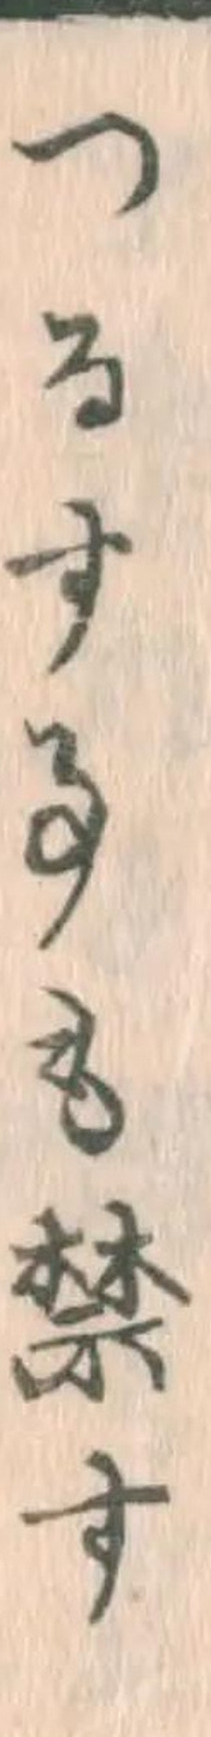つるす事も禁す
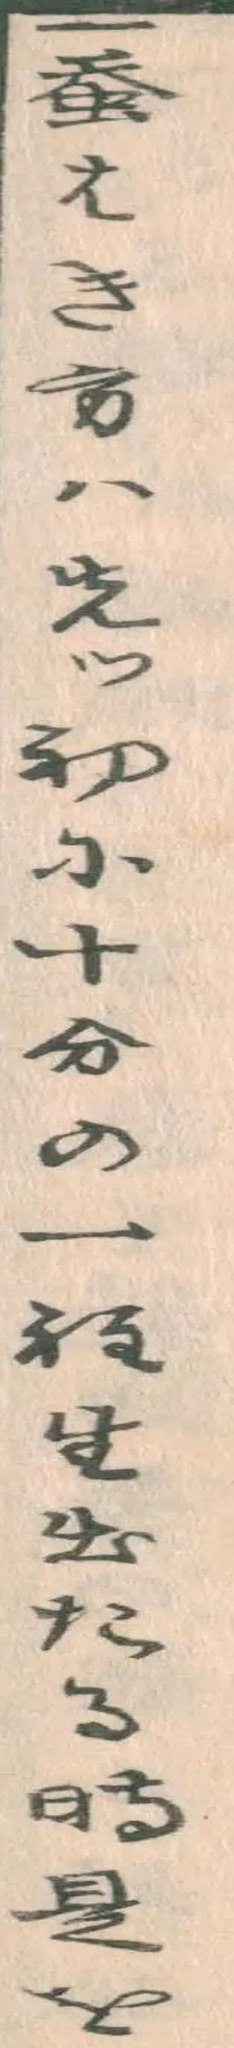一蚕はき方は先つ初に十分の一程生出たる時是を
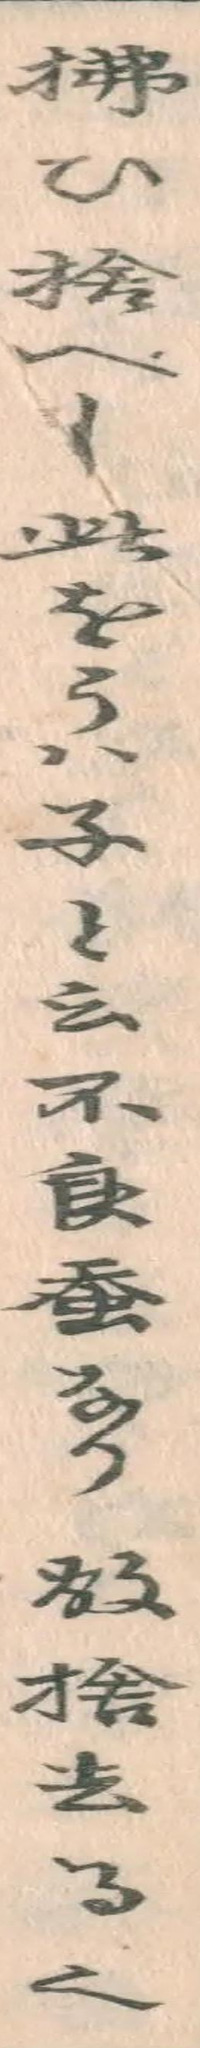払ひ捨へし此をうは子と云不良蚕なり故捨去る也
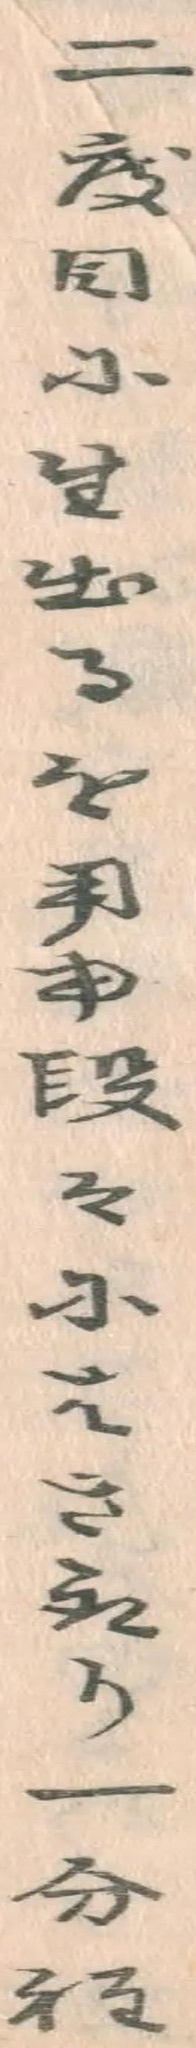二度目に生出るを用ゆ段々にはき取り一分程
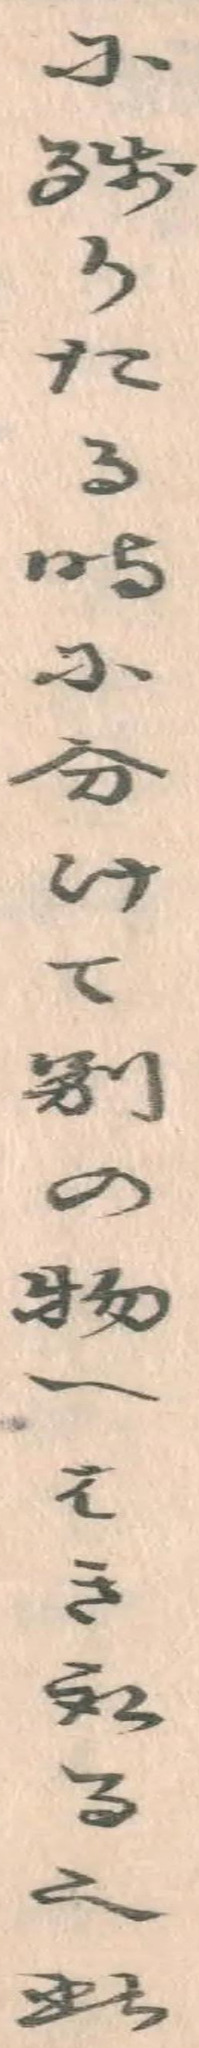に残りたる時に分けて別の物へはき取る也此
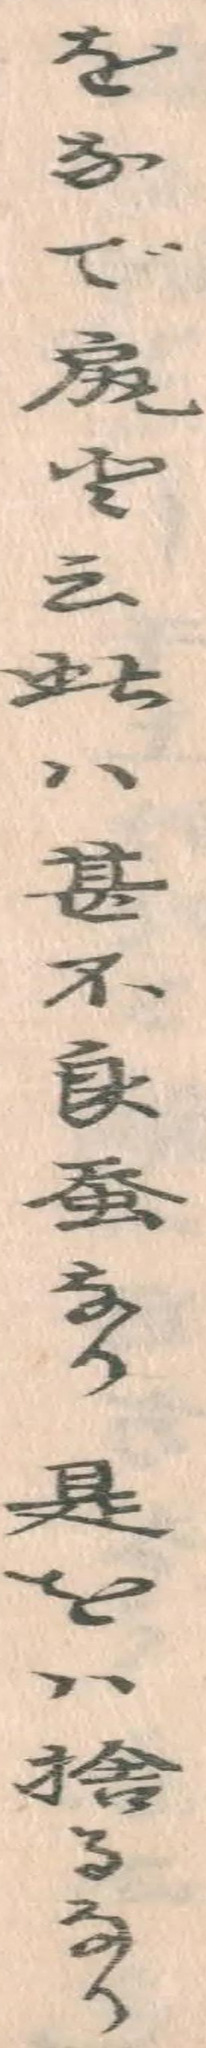をなで尻と云此は甚不良蚕なり是をは捨るなり
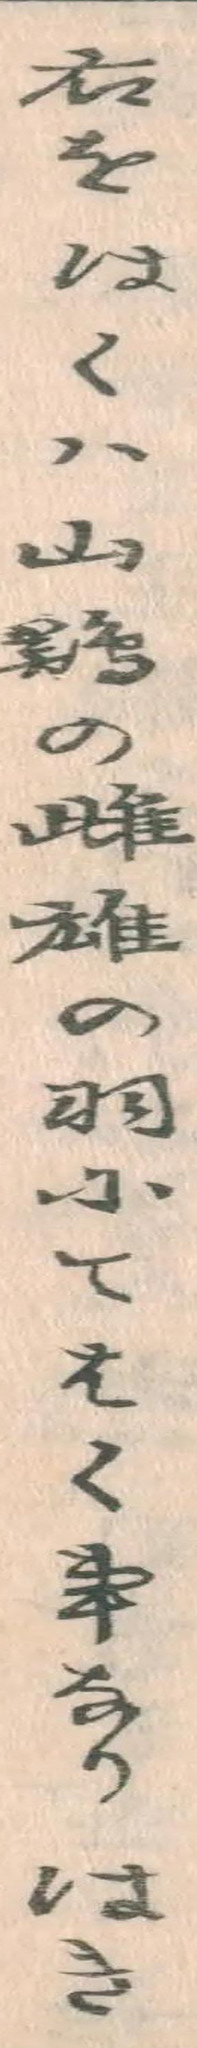右をはくは山鶏の雌雄の羽にてはく事なりはき
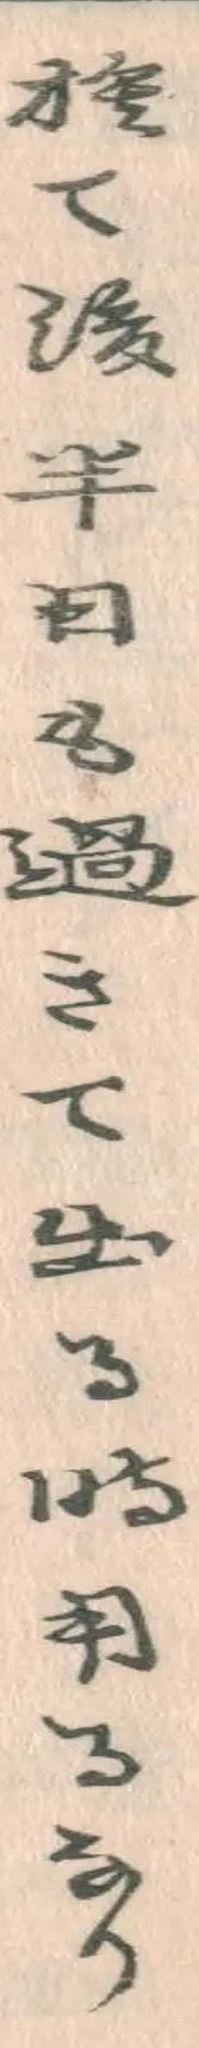捨て後半日も過きて出る時用るなり
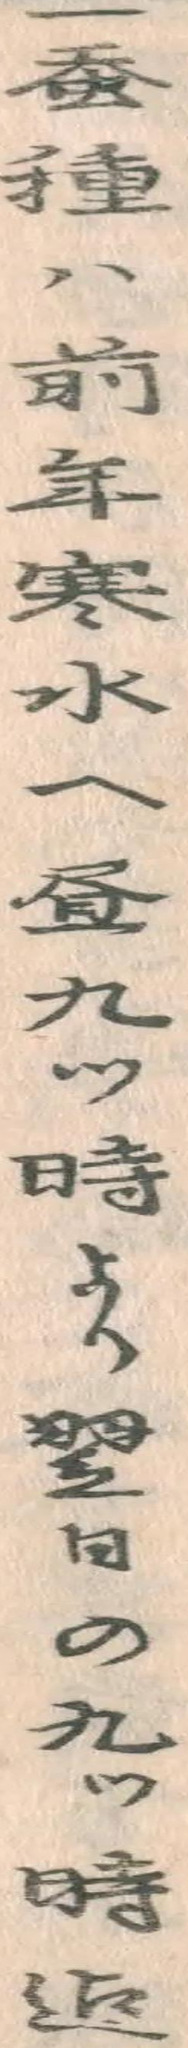一蚕種は前年寒水へ昼九ッ時より翌日の九ッ時迄
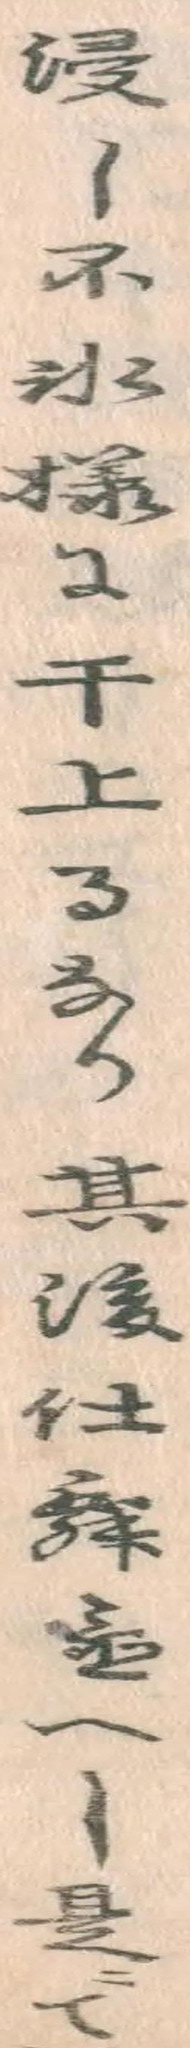浸し不氷様に干上るなり其後仕舞置へし是にて
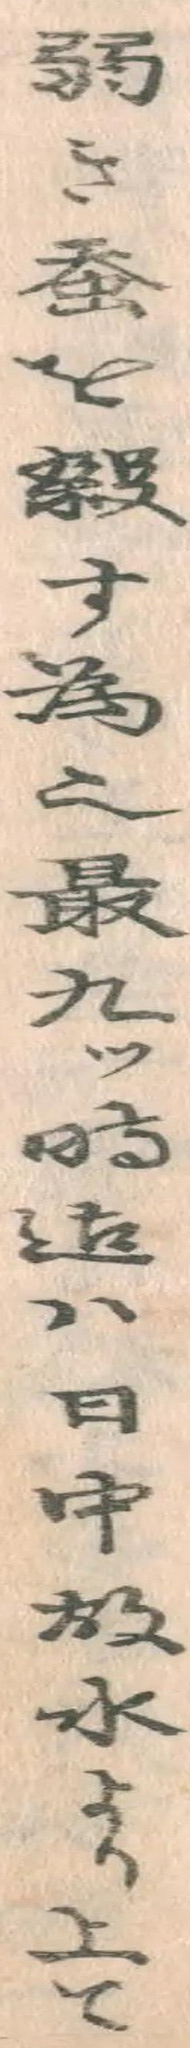弱き蚕を殺す為也最九ッ時迄は日中故水より上て
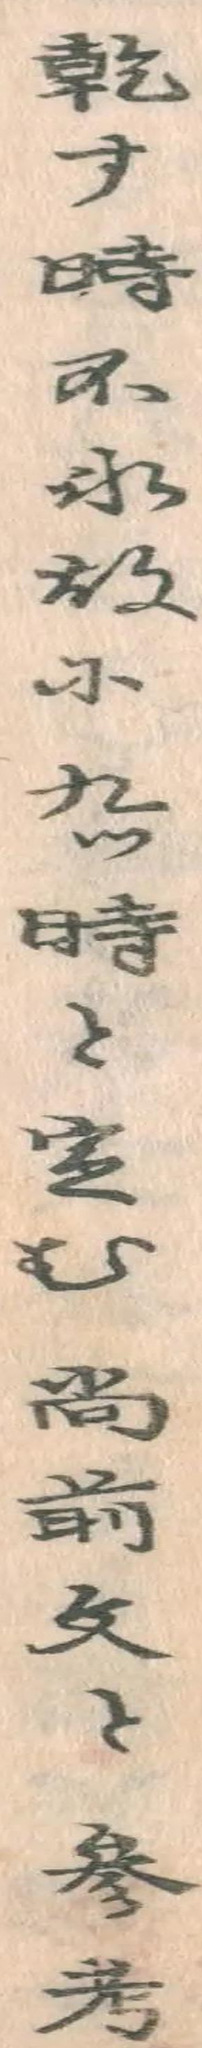乾す時不氷故に九ッ時と定む尚前文と参考
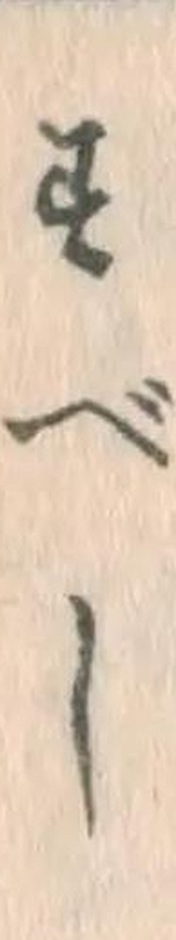すべし
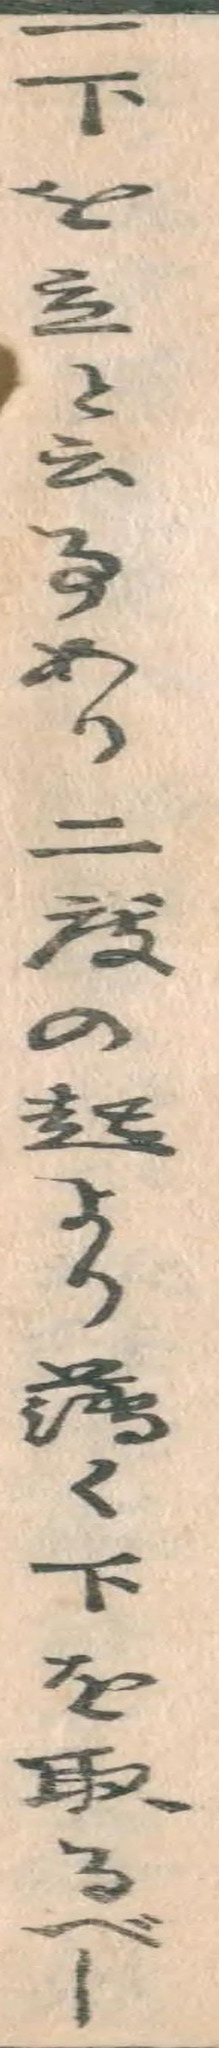一下を立と云事あり二度の起より薄く下を取るべし
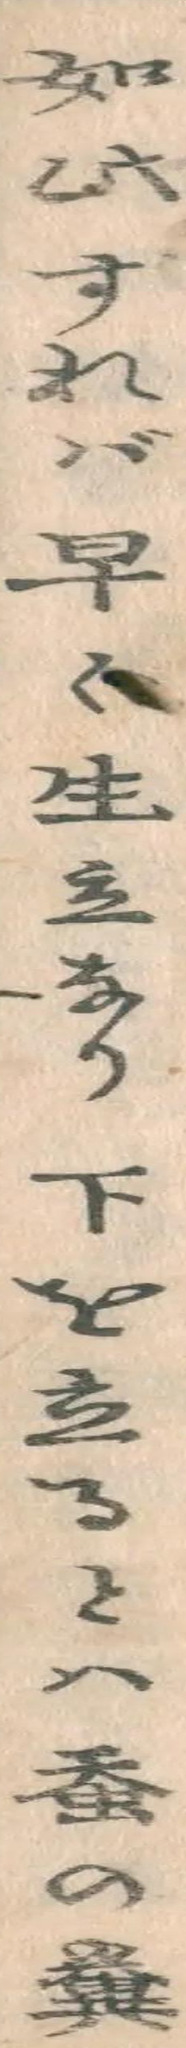如此すれば早く生立なり下を立るとは蚕の糞

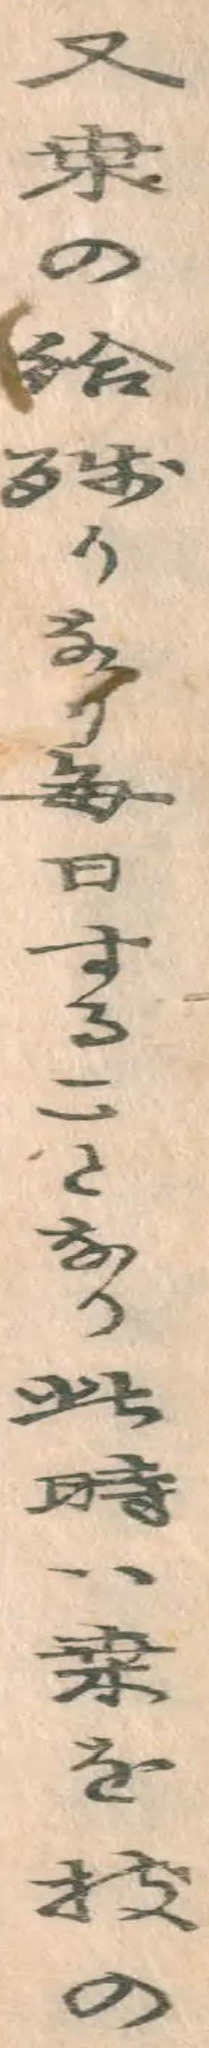又桑の給残りなり毎日することなり此時は桑を枝の
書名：機織彙編 5巻. [1]
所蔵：国立国会図書館 National Diet Library, JAPAN
